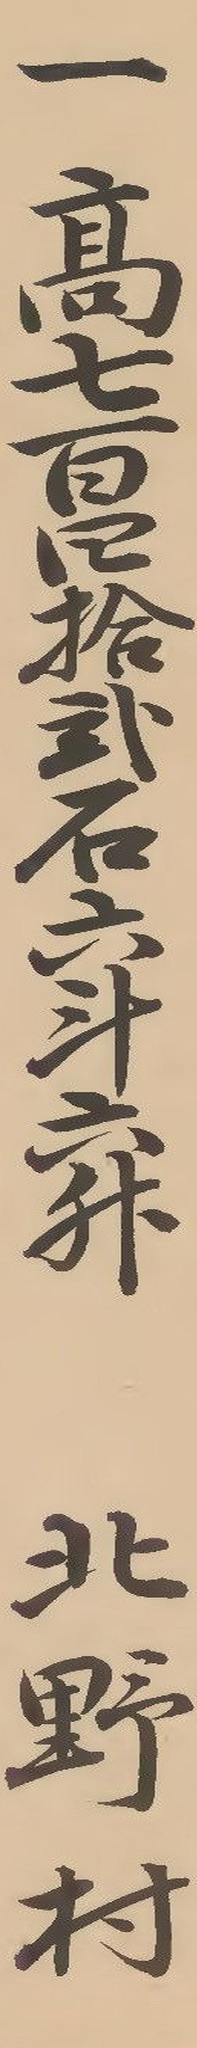一高七百四拾弐石六斗六升北野村
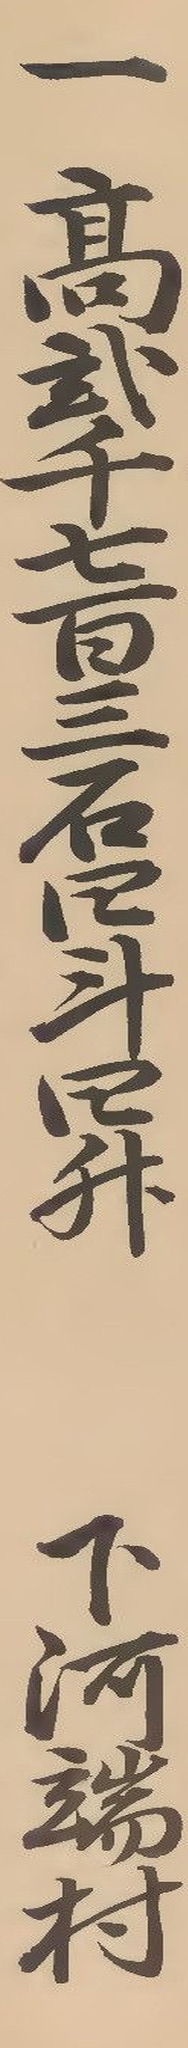一高弐千七百三石四斗四升下河端村
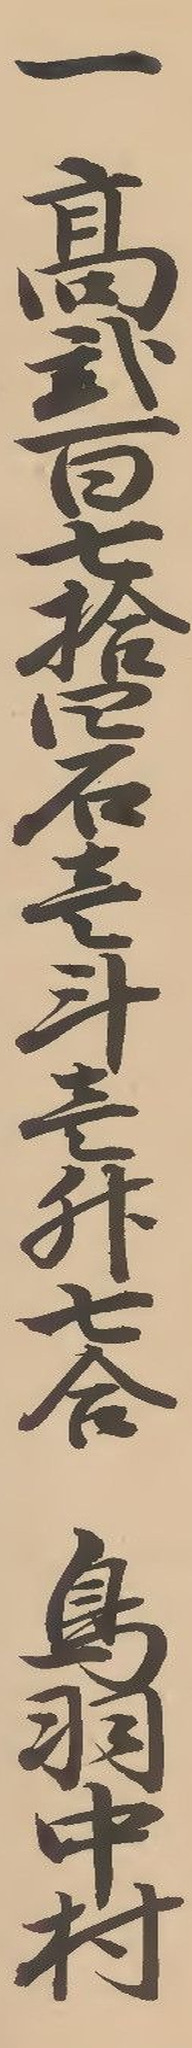一高弐百七拾四石壱斗壱升七合鳥羽中村
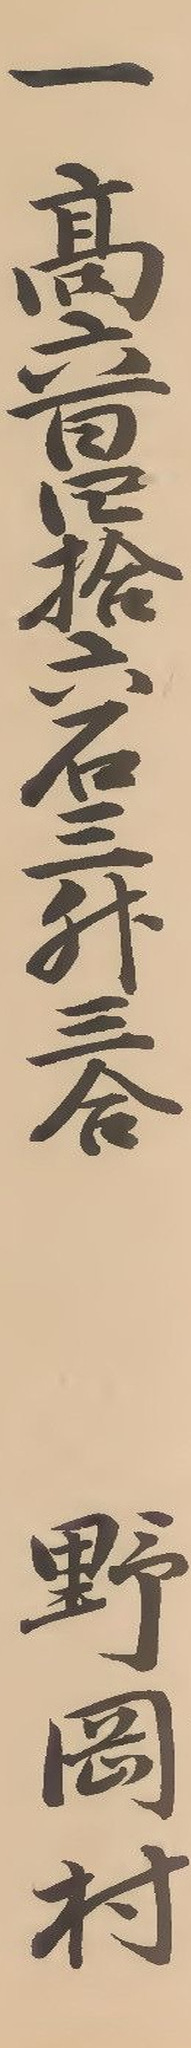一高六百四拾六石三升三合野岡村
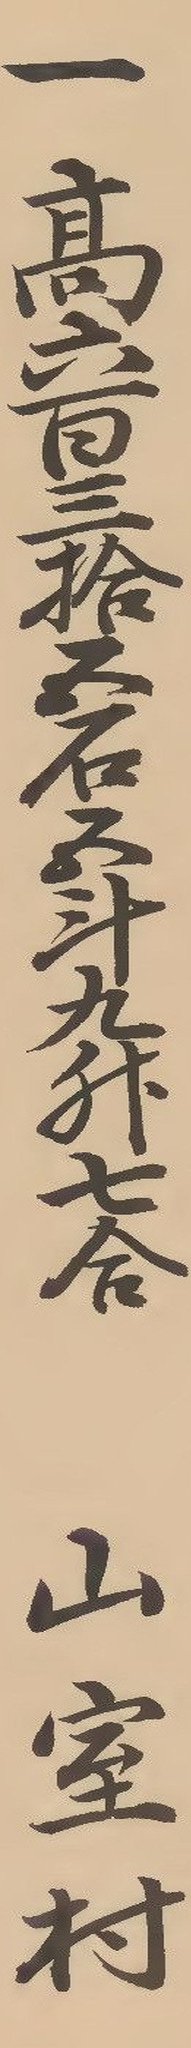一高六百三拾五石五斗九升七合山室村
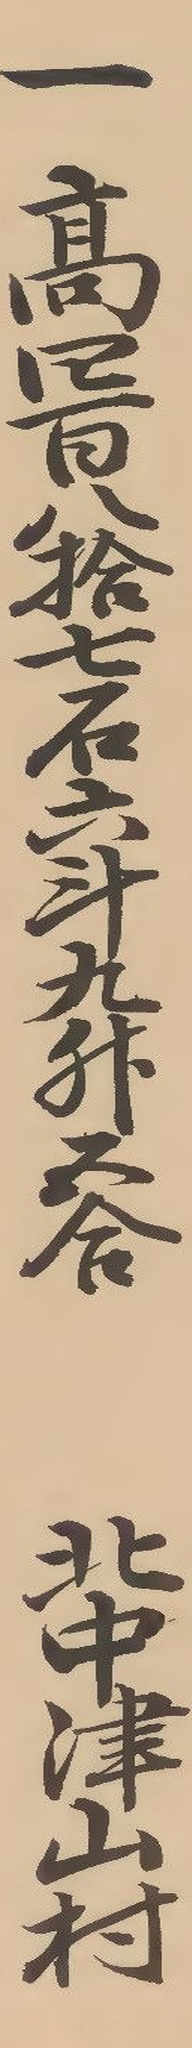一高四百八拾七石六斗九升五合北中津山村
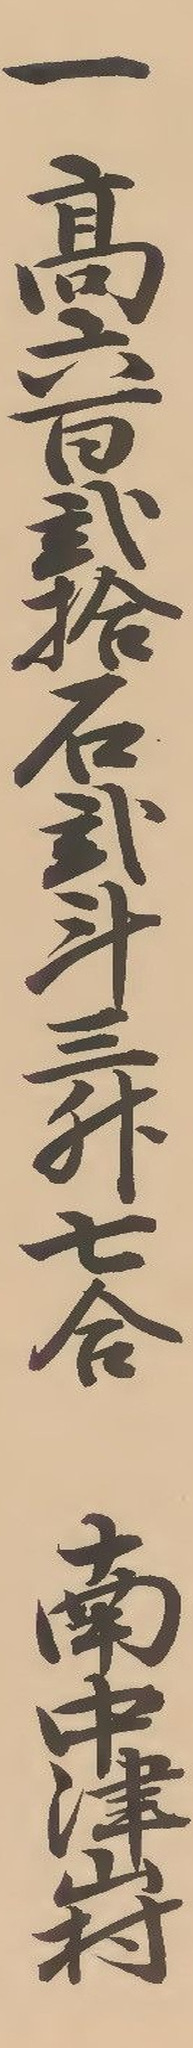一高六百弐拾石弐斗三升七合南中津山村

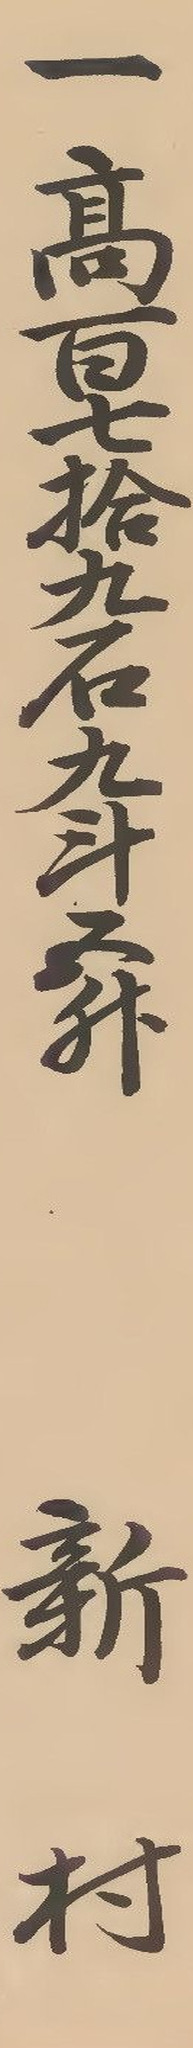一高百七拾九石九斗五升新村
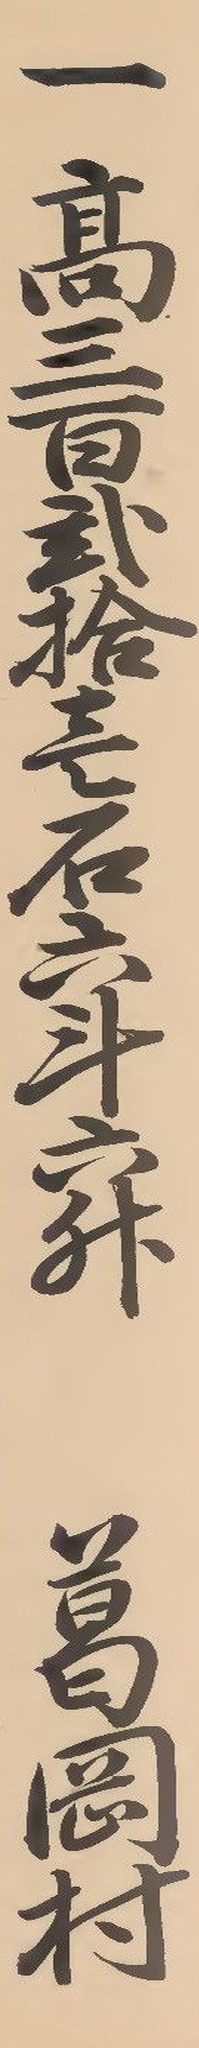一高三百弐拾壱石六斗六升葛岡村
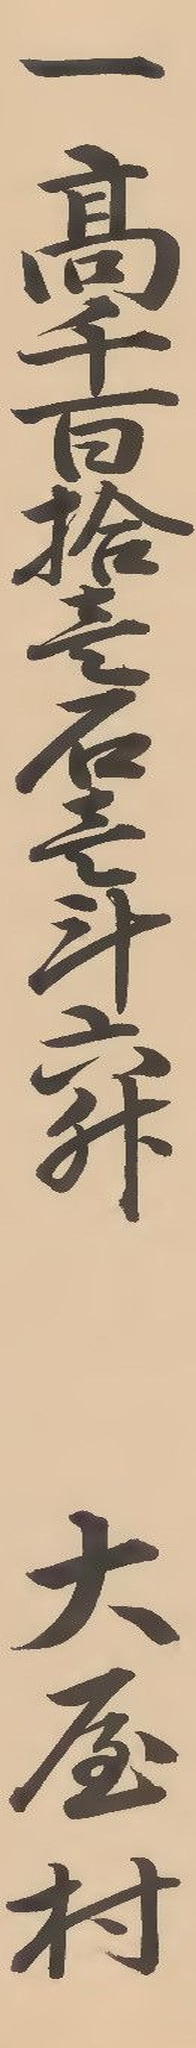一高千百拾壱石壱斗六升大屋村
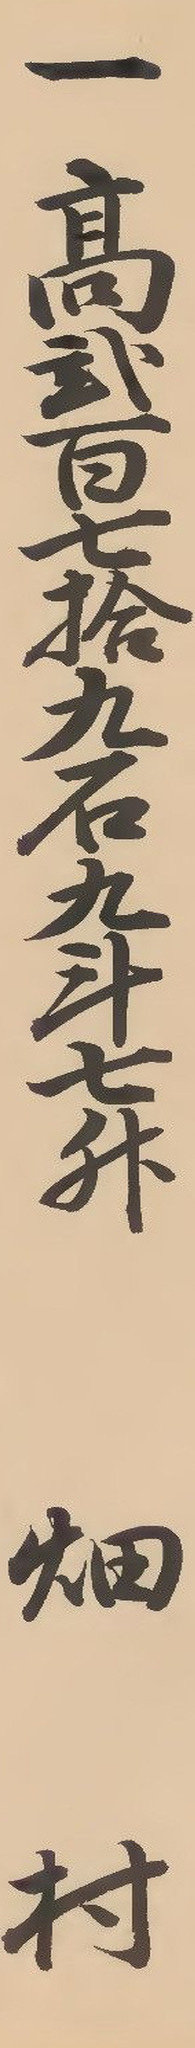一高弐百七拾九石九斗七升畑村
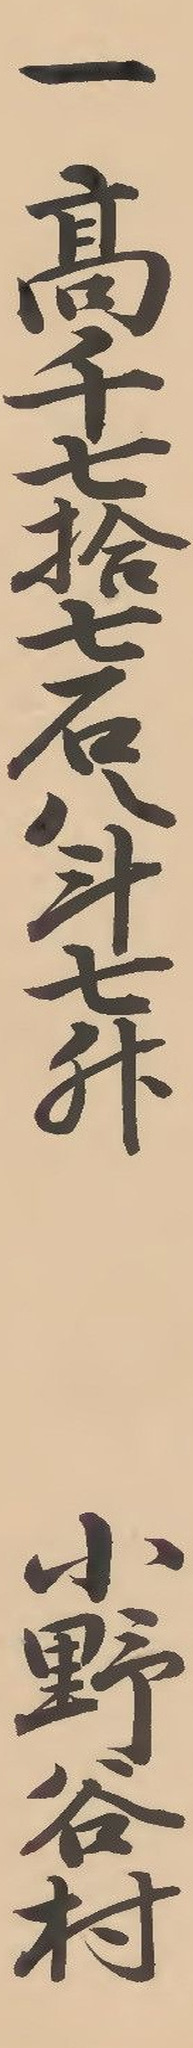一高千七拾七石八斗七升小野谷村

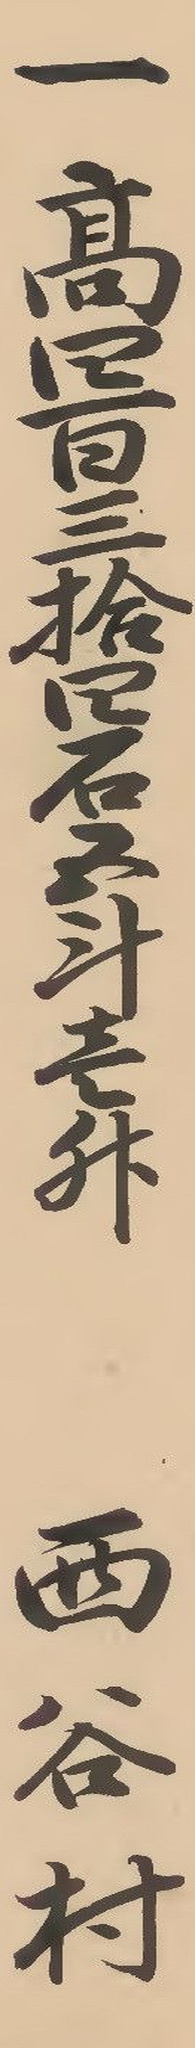一高四百三拾四石五斗壱升西谷村
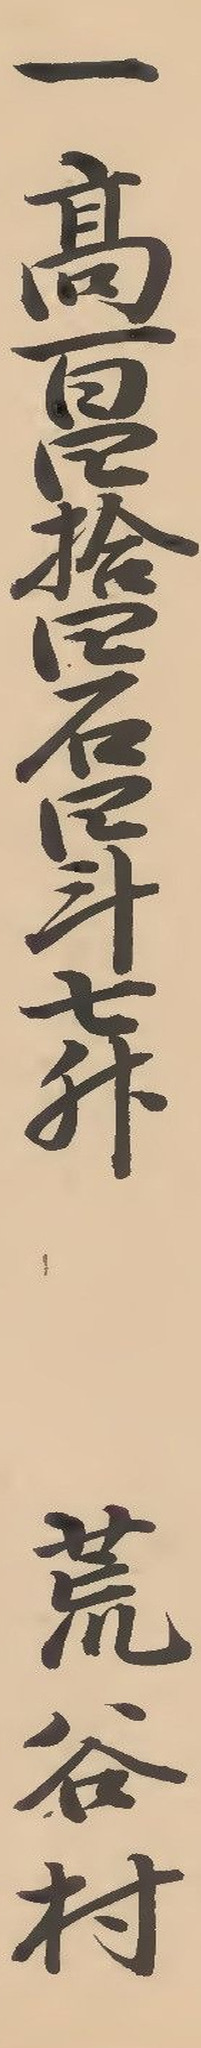一高百四拾四石四斗七升荒谷村
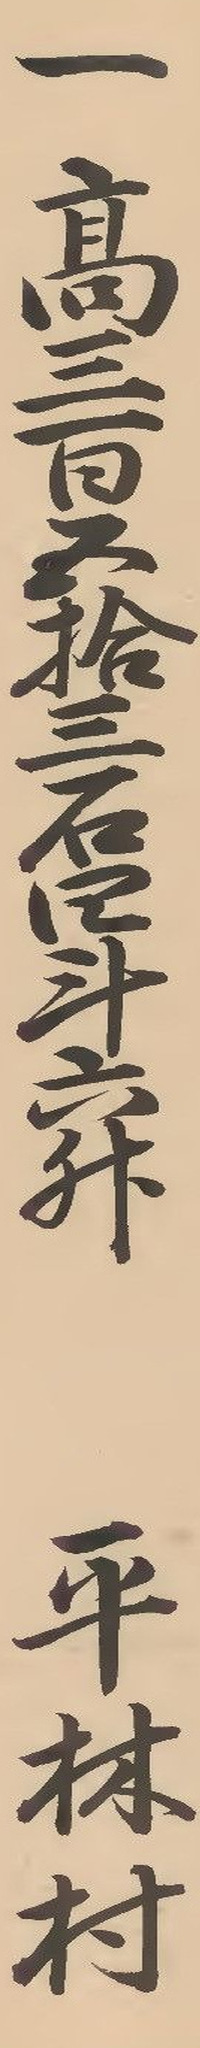一高三百五拾三石四斗六升平林村
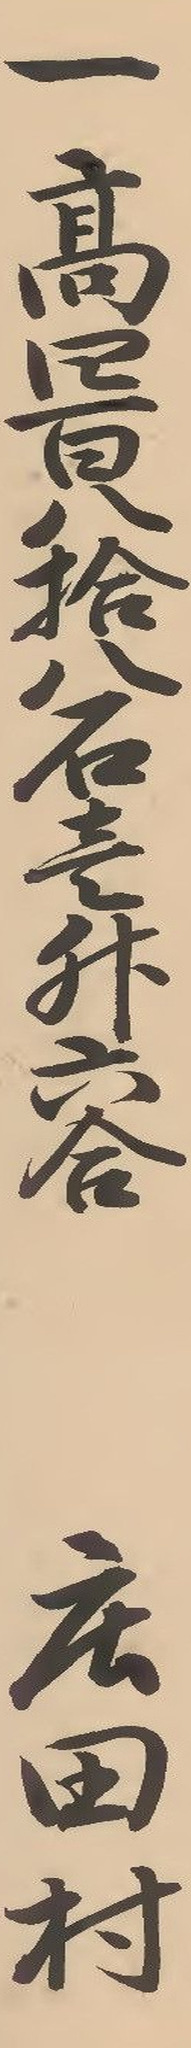一高四百八拾八石壱升六合庄田村
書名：越前国郷帳
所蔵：国立公文書館 National Archives of Japan
